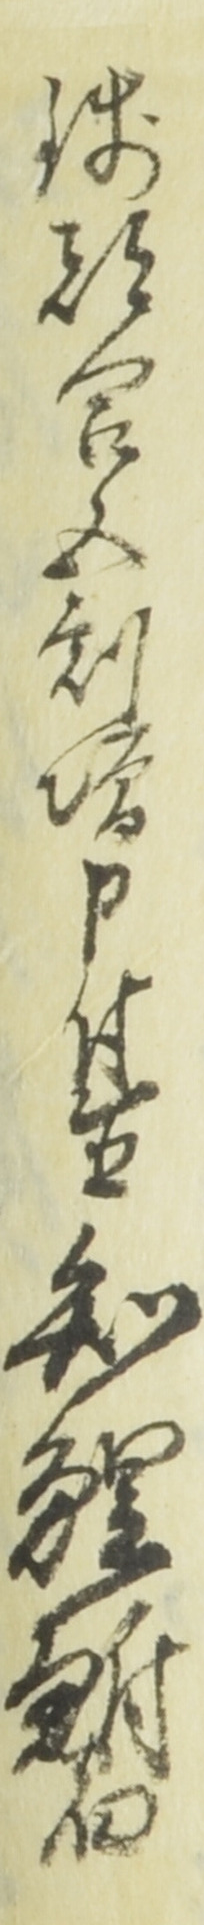銭都合五割増申付置池鯉鮒宿
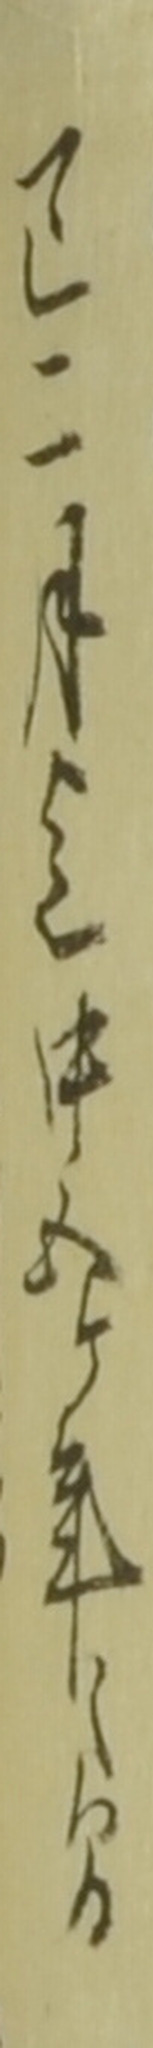二月迄中五ヶ年之間
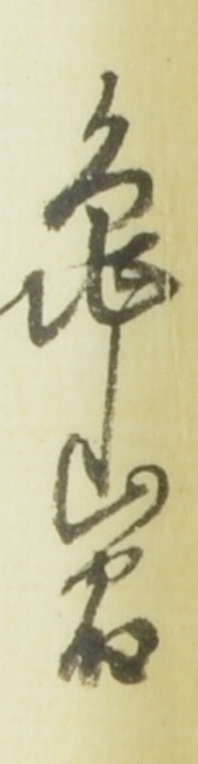亀山宿
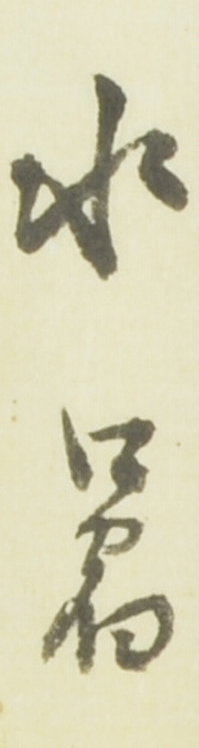水口宿
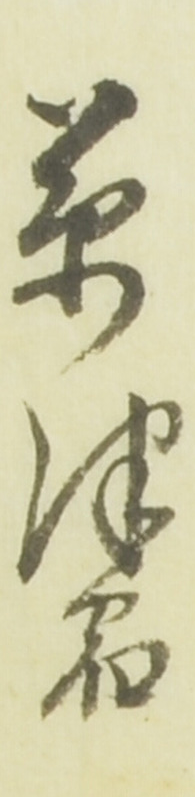草津宿
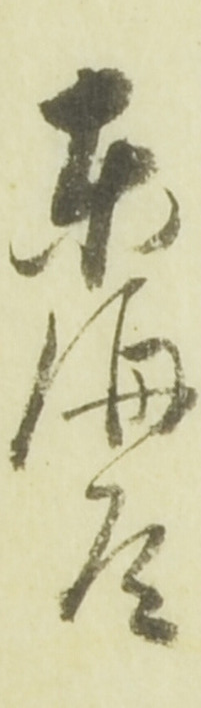東海道
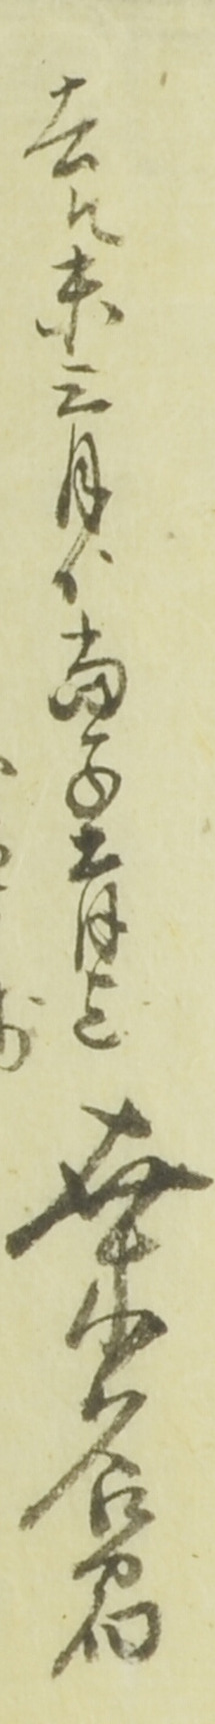去ル未三月ゟ当子十一月迄桑名宿
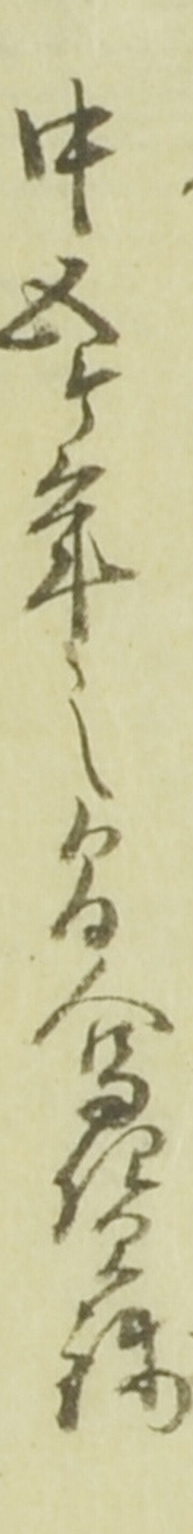中五ヶ年之間人馬賃銭
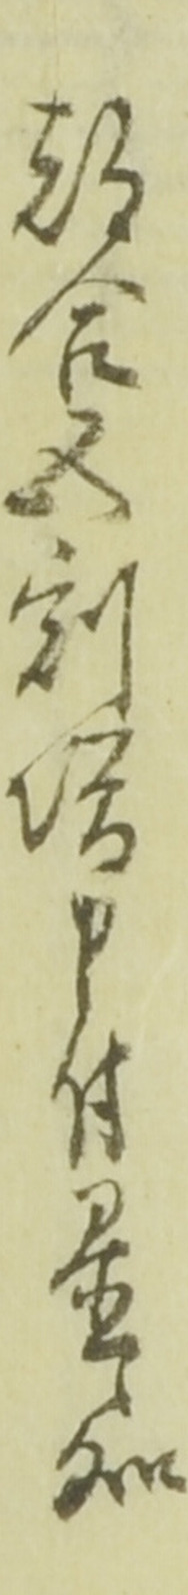都合五割申付置候処
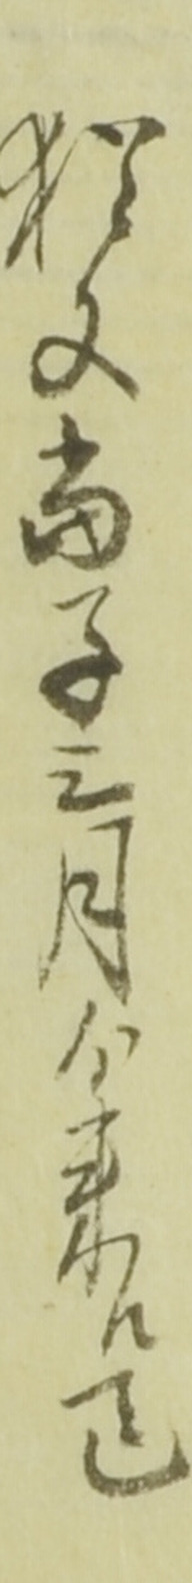猶又当子三月ゟ来ル巳
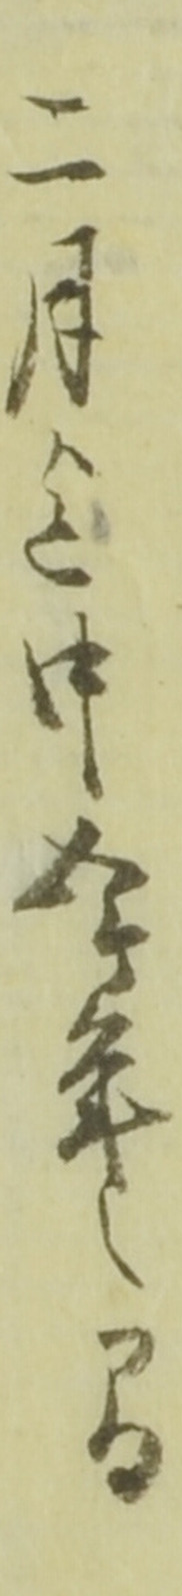二月迄中五ヶ年之間
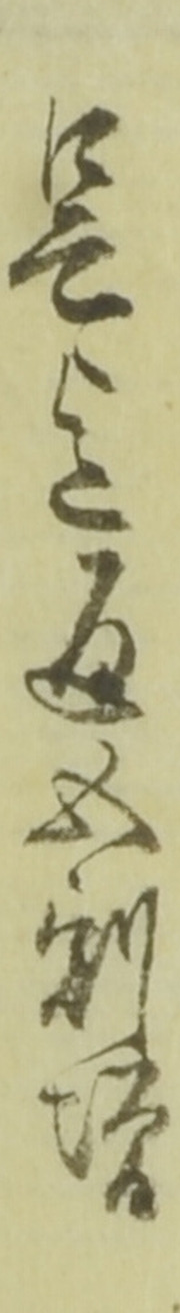是迄通五割増
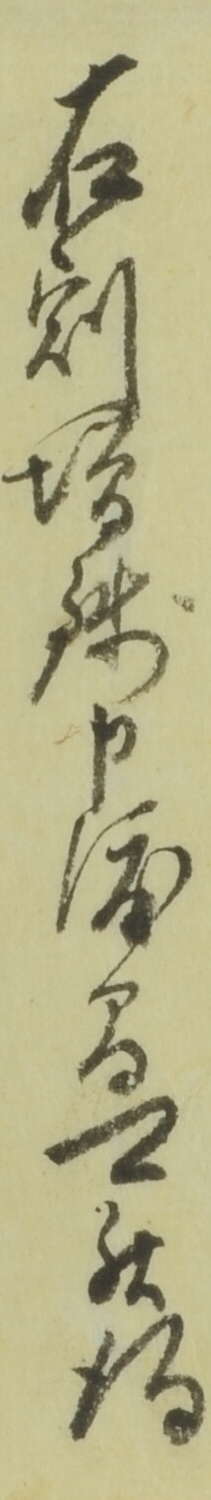右割増銭申渡間可被為
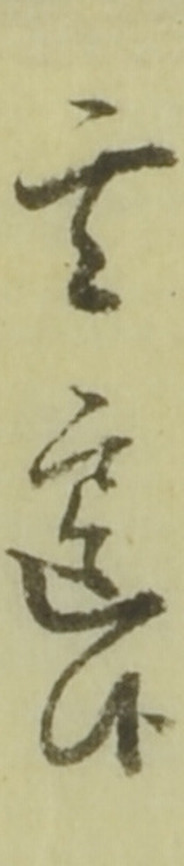其意候
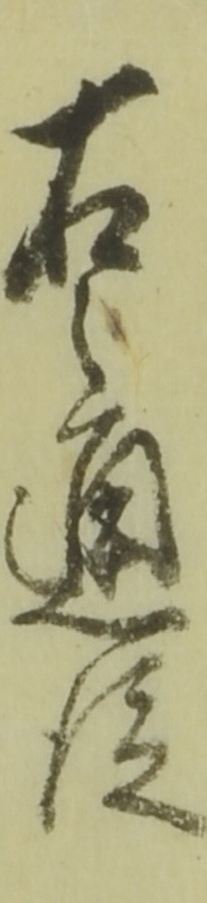右之通従
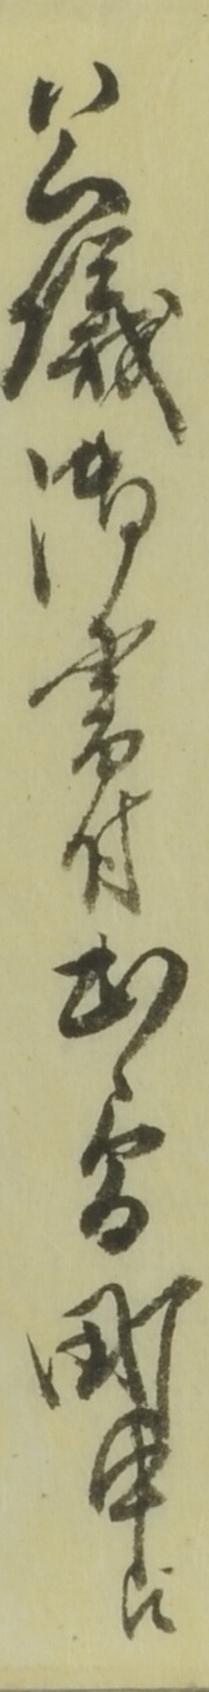公儀御書付出候間町中江
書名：御触書御書附控
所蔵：伊那市立高遠町図書館・合同会社AMANE
